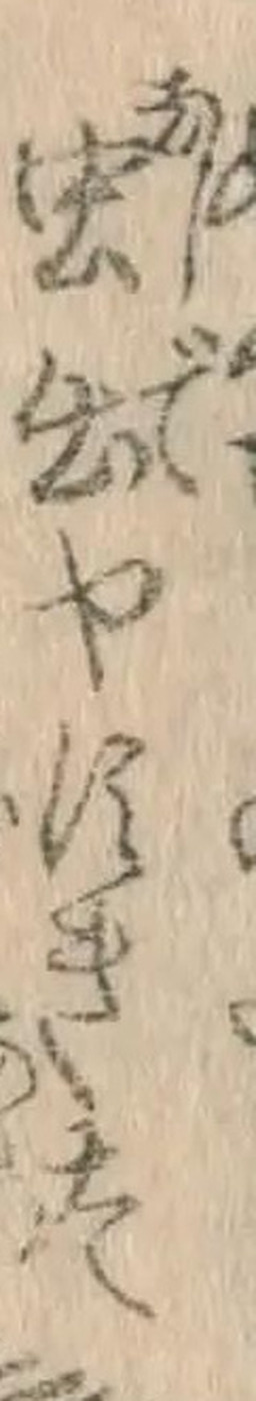虫出やすきた
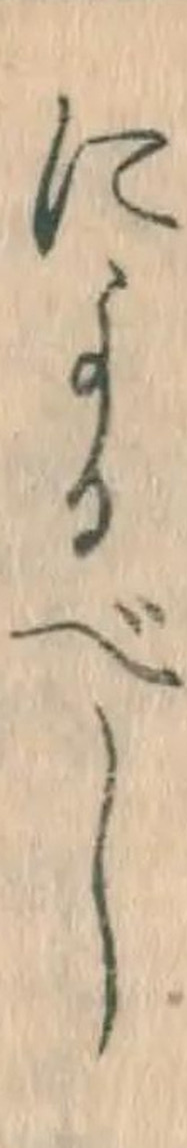によるべし
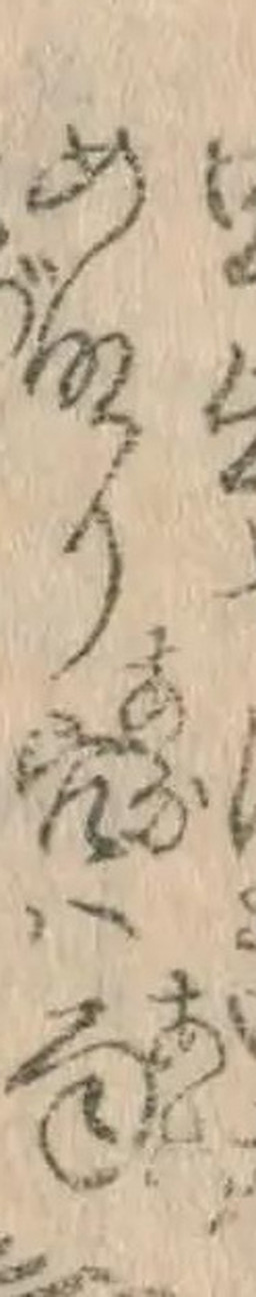めなり穴は雨
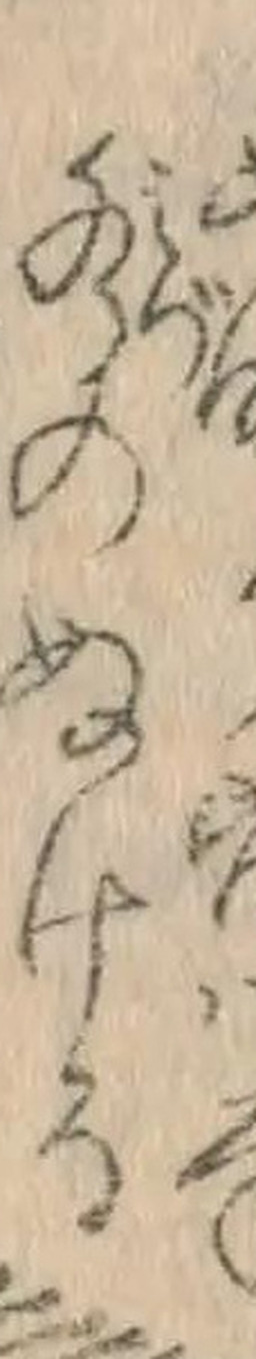水のぬける
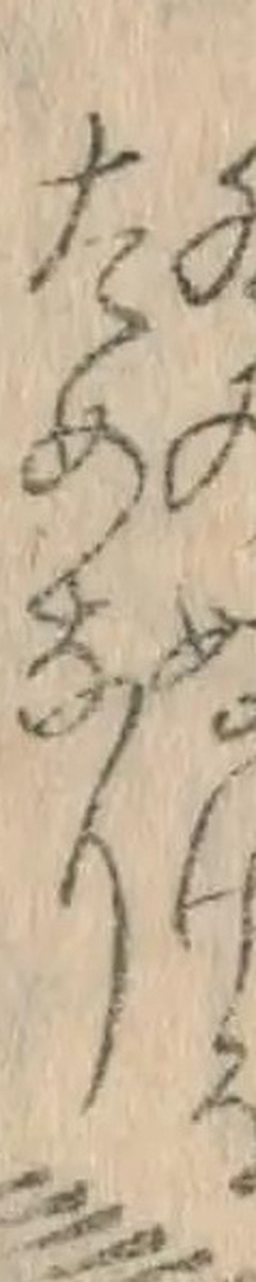ためなり
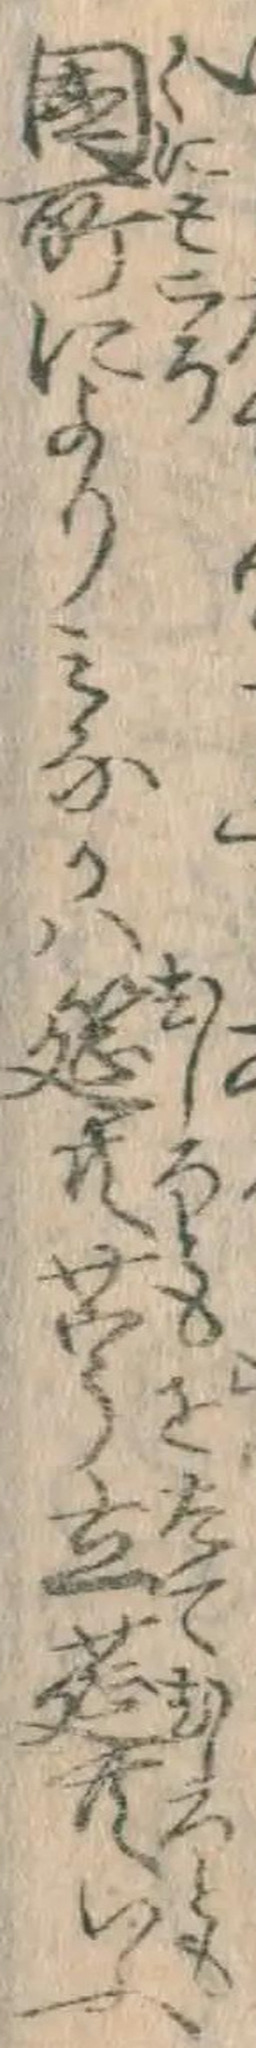國所によりみなかは筵共苧立筵共いふ
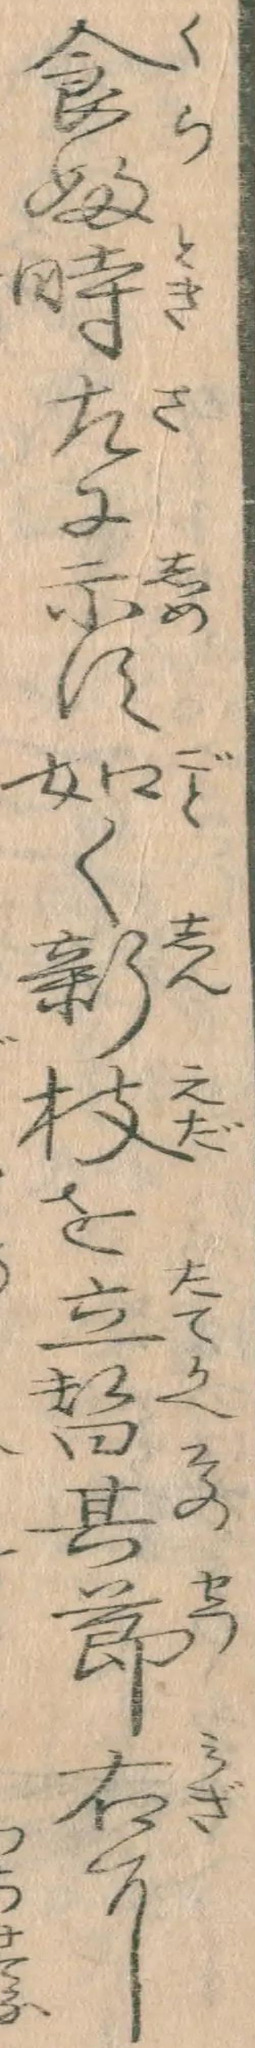食ふ時左に示す如く新枝を立替其節右に
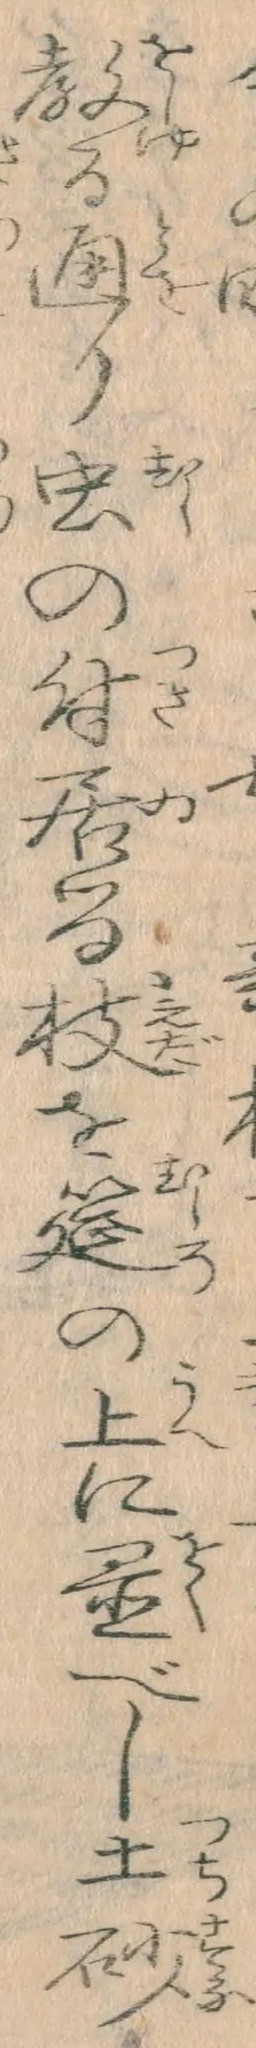教る通り虫の付居る枝を筵の上に置べし土砂
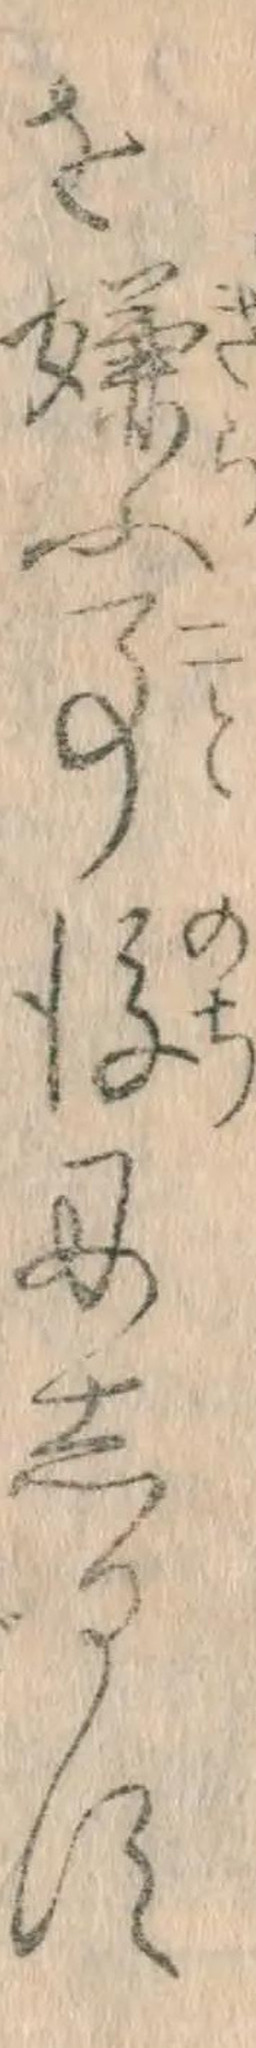を嫌ふ事後にしるす
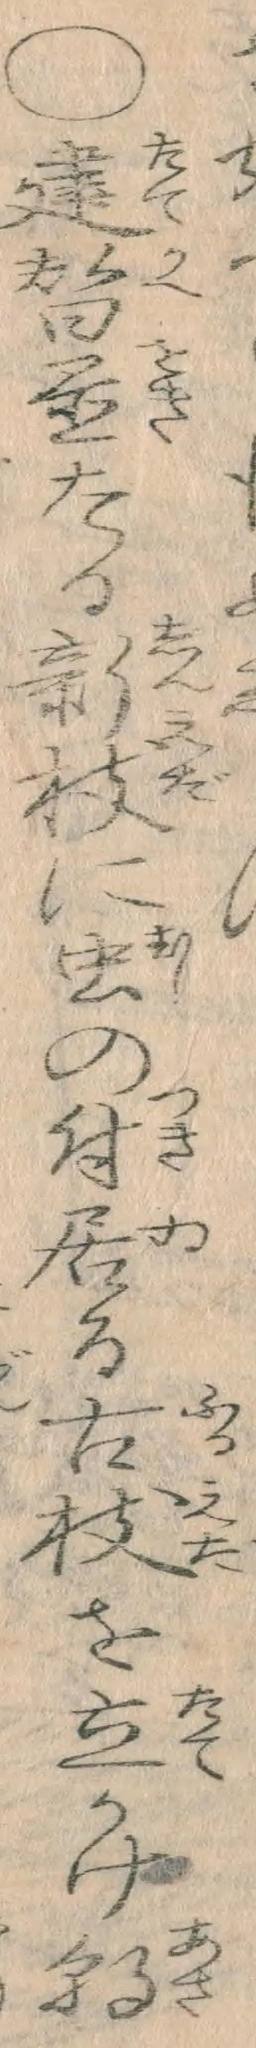○建替置たる新枝に虫の付居る古枝を立かけ朝
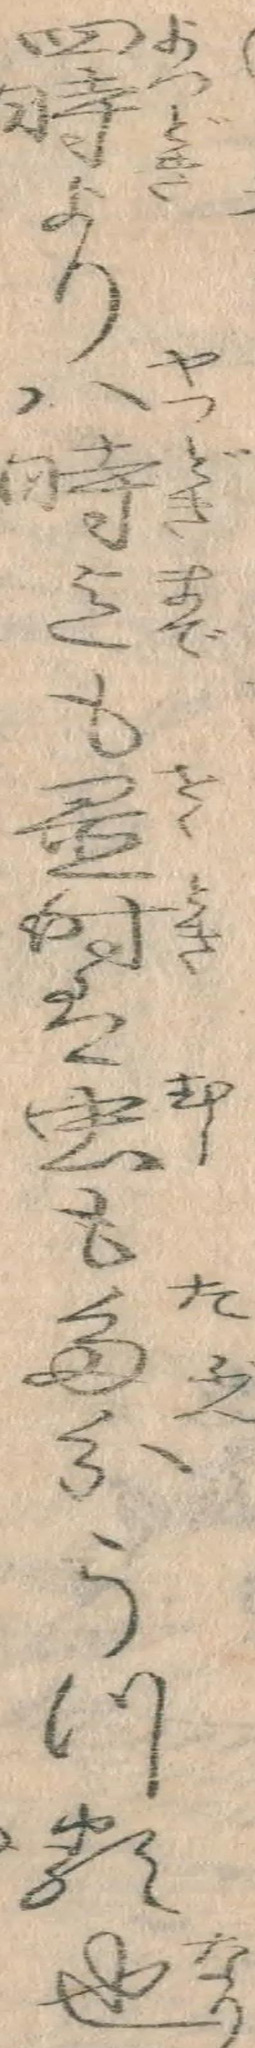四時より八時迄も置時は虫も多分うつる也
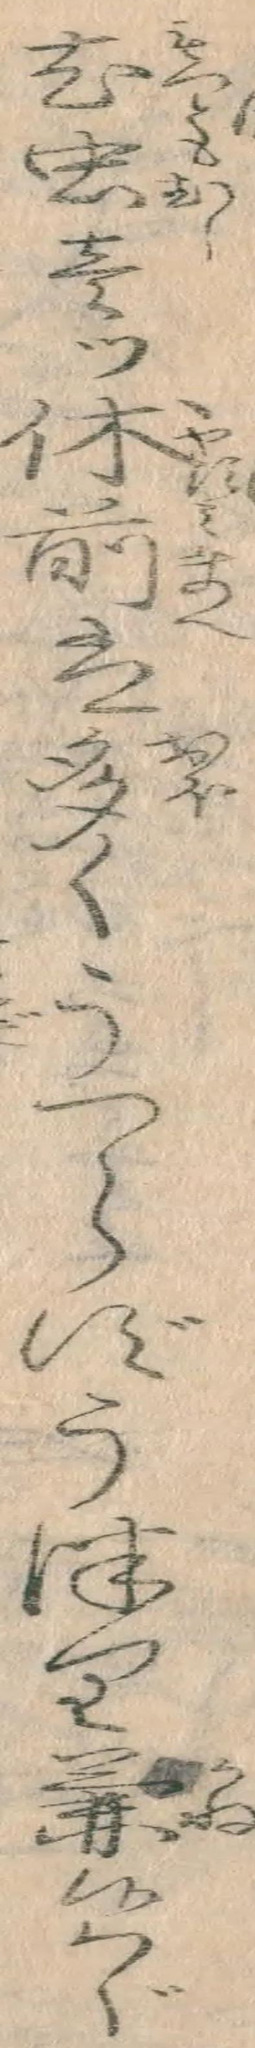尤虫壱ツ休前は多くうつらずうつり兼候はゞ
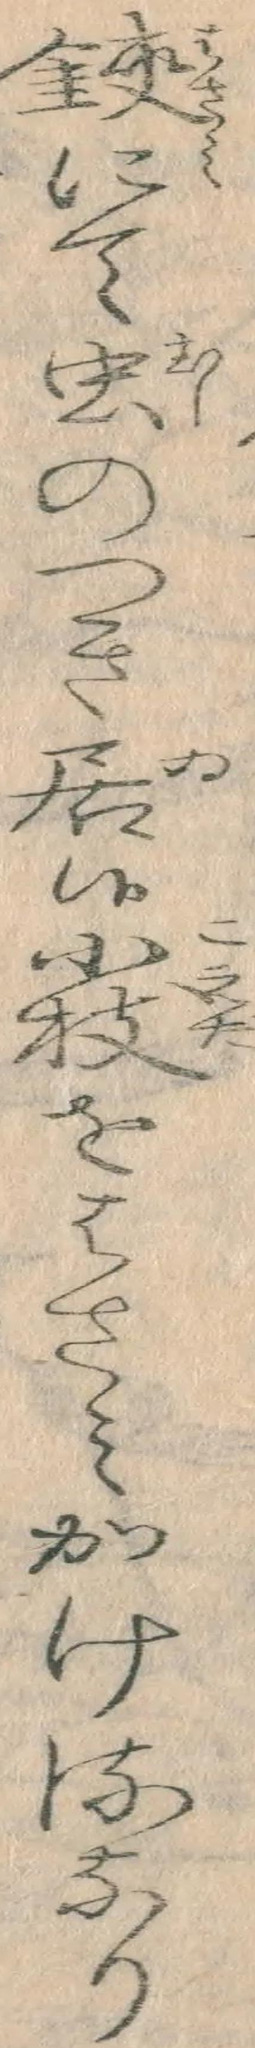鋏にて虫のつき居候小枝をはさみかけるなり
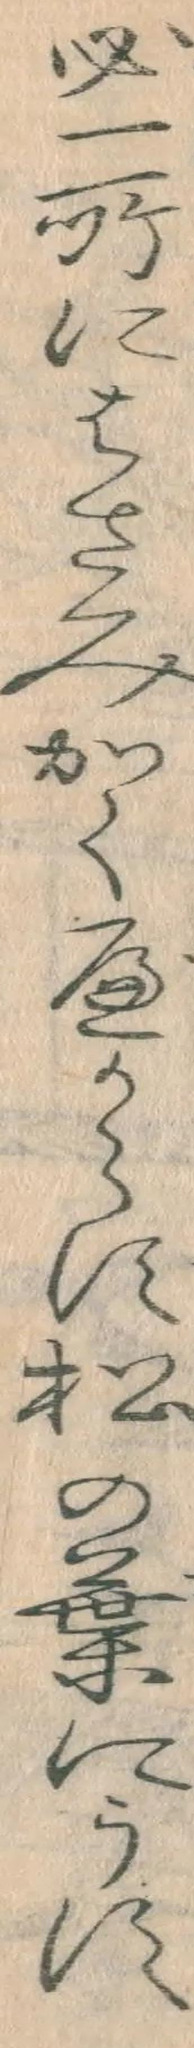必一所にはさみかくべからず松の葉にうす
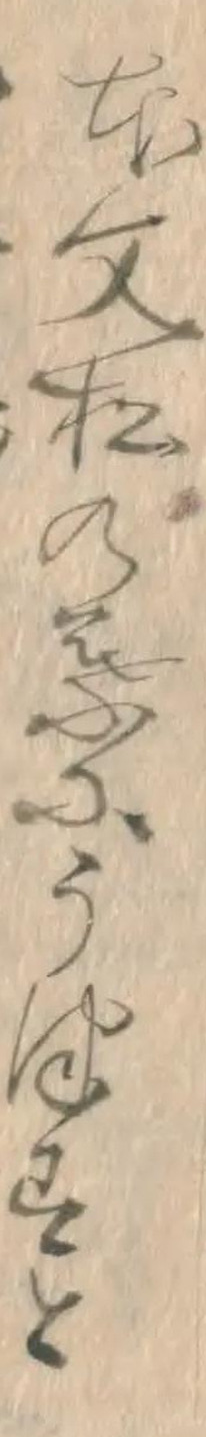本文松の葉うつすと
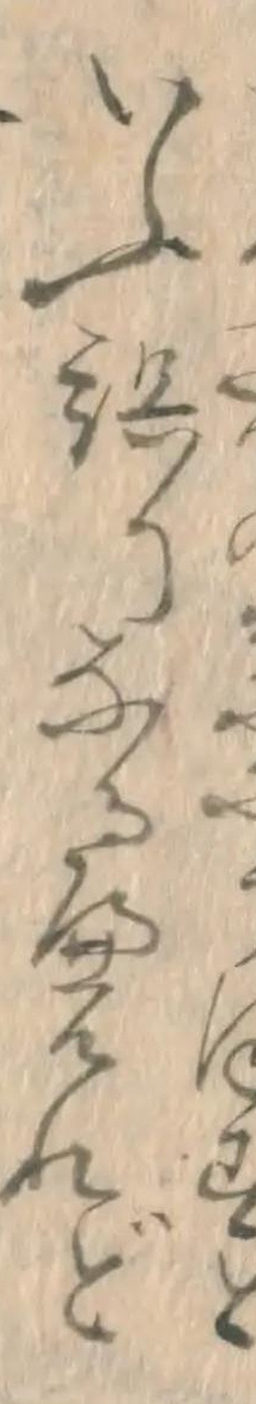いふ誤りなるへけれど
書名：山繭養法秘傳抄
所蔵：国立国会図書館 National Diet Library, JAPAN
